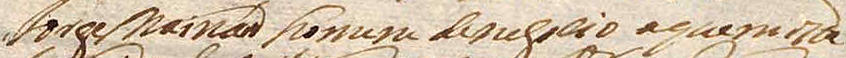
Iorge Mainard homem de negocio a quem esta
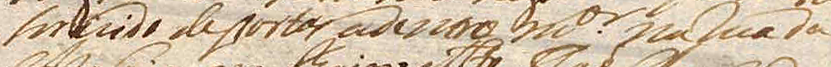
E resido de portas adentro m.or na Rua da
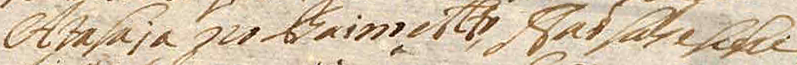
Atalaia no Bairro Alto, Naõ sabe se he
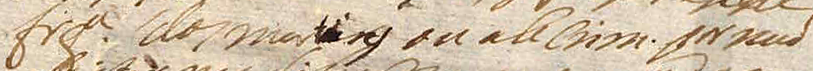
frg.a dos martires, ou alecrim. por naõ
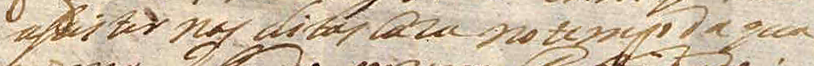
assistir nas ditas caza no tempo da qua
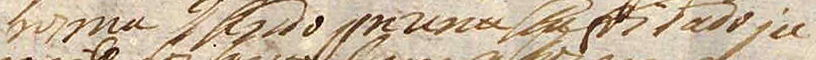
resma E sendo prezente lhe foi dado ju
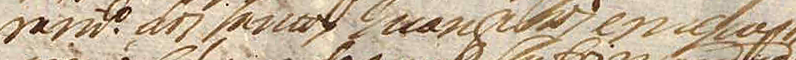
ram.to dos Santos Euangelhos em que pos
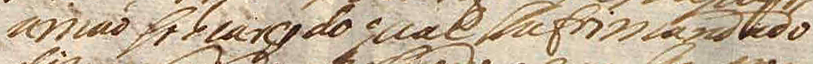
a maõ sob cargo do qual lhe foi mandado
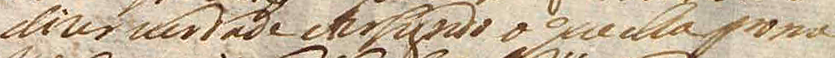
dizer uerdade e ter segndo o que ella prome
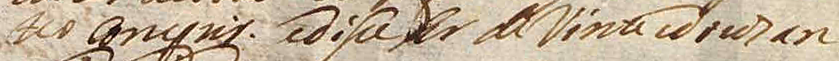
teo comprir. e disse ser de Vinte e dous an
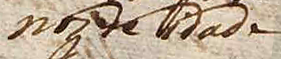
nos de idade
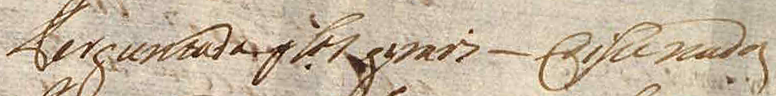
Perguntada p.los gerais - Disse nada
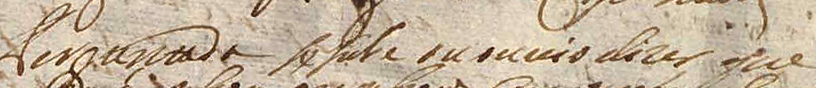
Perguntada se sabe ou ouuio dizer que
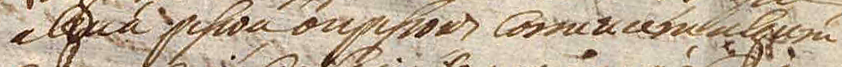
alguã pessoa, ou pessoas cometeram algum
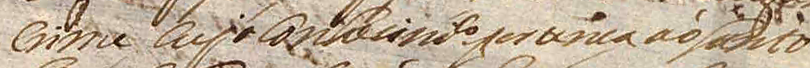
crime cujo conhecimto pertença ao Santo
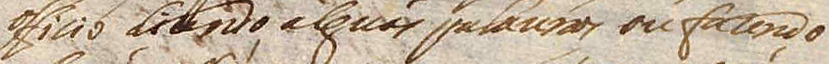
officio dizendo, alguās palauras ou fazendo
